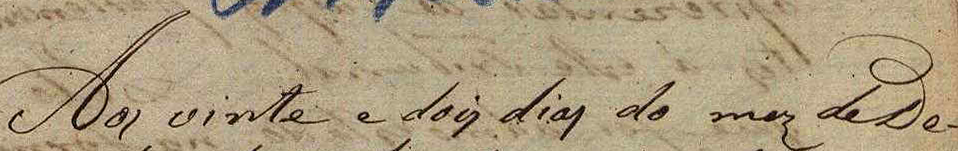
Aos vinte e dois dias do mez de De
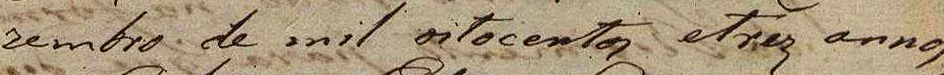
zembro de mil oitocentos e trez annos,
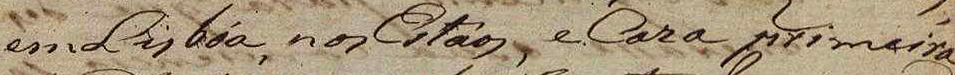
em Lisboa, nos Estáos, e Caza primeira
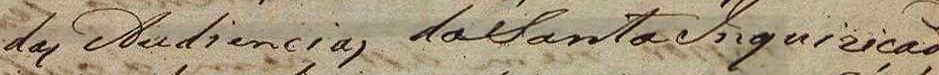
das Audiencias, da Santa Inquiziçaõ,
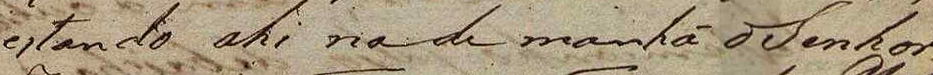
estando ahi na de manhã o Senhor
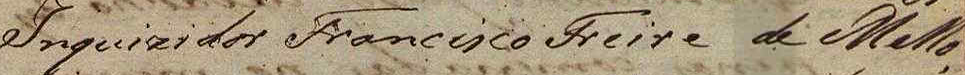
Inquizidor Francisco Freire de Mello,
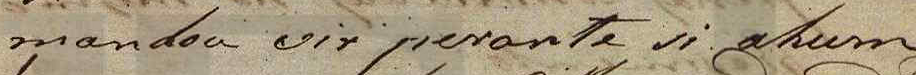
mandou vir perante si a hum
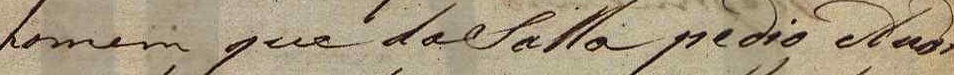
homem, que da Salla pedio Audi
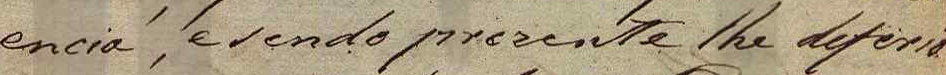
encia, e sendo prezente lhe deferio
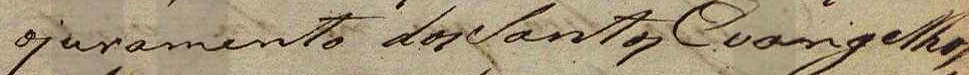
o juramento dos Santos Evangelhos,
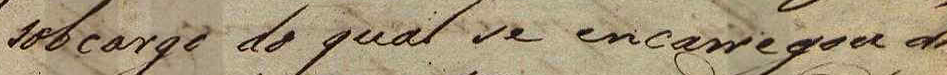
sob cargo do qual se emcarregou di
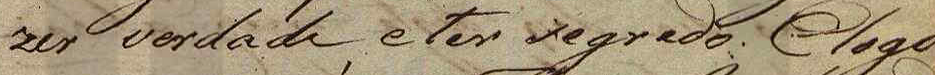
zer verdade, e ter segredo. E logo
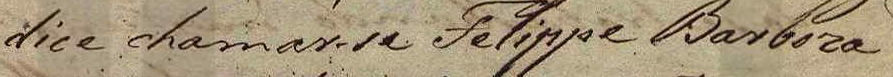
dice chamar-se Felippe Barboza
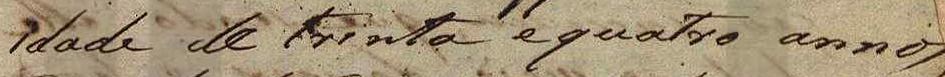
idade de trinta e quatro annos
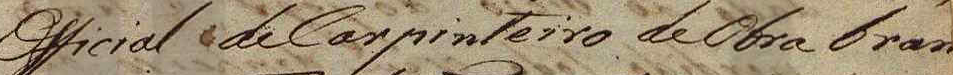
Official de Carpinteiro de Obra bran
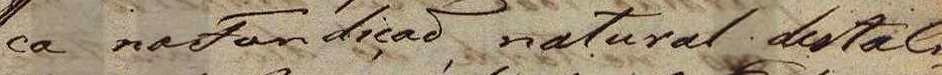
ca na Fundiçaõ, natural desta Ci
